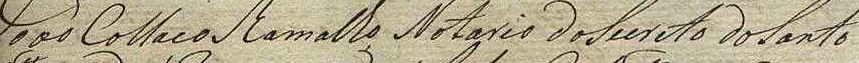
Ioaõ Collaço Ramalho, Notario do Secreto do Santo
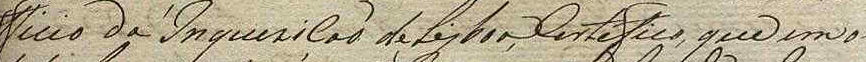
ficio da InquiziÇaõ de Lisboa, Certefico, que em o
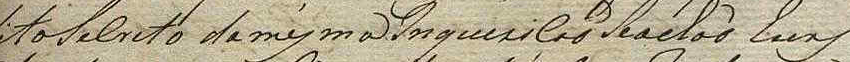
ito SeCreto da mesma InquiziÇaõ Se achaõ huns
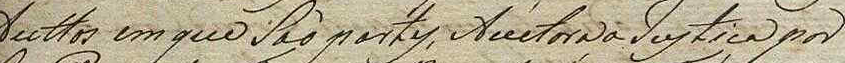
Auttos em que Saõ partes, Auctora a Iustiça por
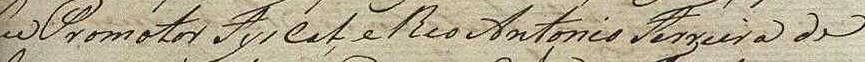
u Promotor FysCal, e Reo Antonio Ferreira de
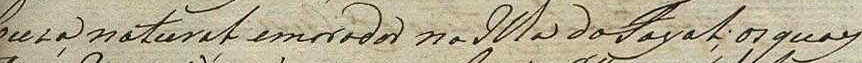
ouza, natural, e morador na Ilha do Fayal; os quaes
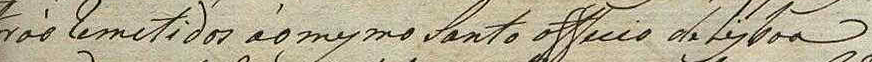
raõ Remetidos áo mesmo Santo officio de Lisboa
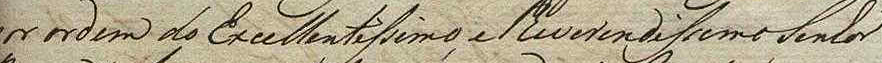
or ordem do Excellentisismo, e Reverendissimo Senhor
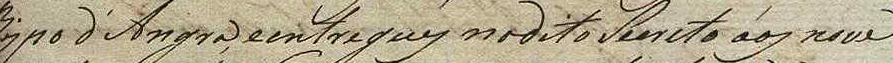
Bispo d'Angra, e entregues no dito Secreto áos nove
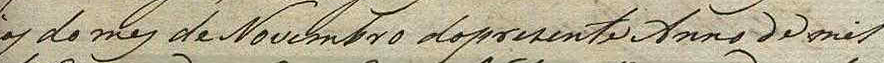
as do mes de Novembro do prezente Anno de mil
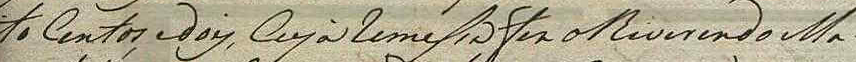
toCentos, e dois, Cuja Remessa fez o Riverendo Ma
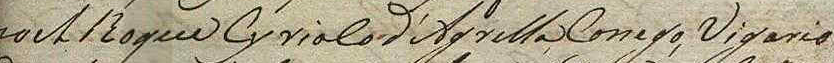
oel Roque CyrioCo d'Agrella, Conego, Vigario
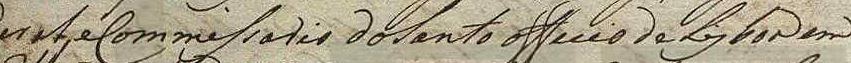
eral e Commissario do Santo officio de Lisboa em
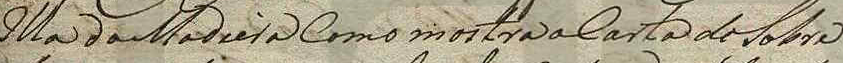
Ilha da Madeira Como mostra a Carta do Sobre
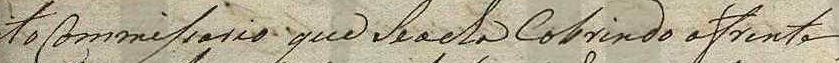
to Commissario que Se acha Cobrindo a frente
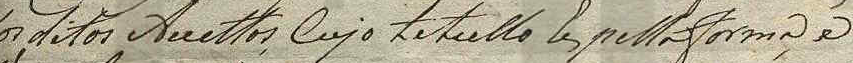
os ditos Aucttos, Cujo titullo he pella forma, e
